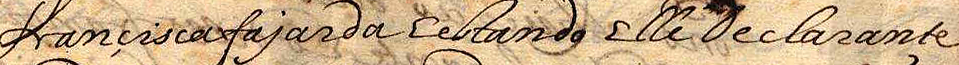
françisca fajarda E estando Elle Declarante
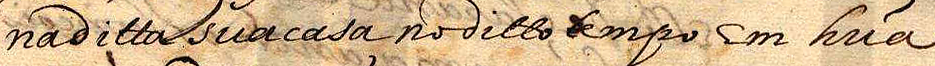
na ditta sua casa no ditto tempo Em huā
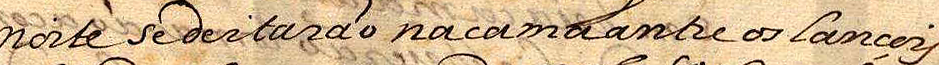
noite se deitaraõ na cama antre os lançois
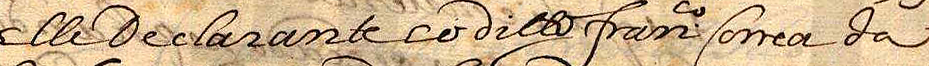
Elle Declarante E o ditto franco. Correa da
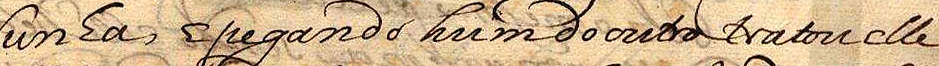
Cunha, E pegando hum do outro tratou elle
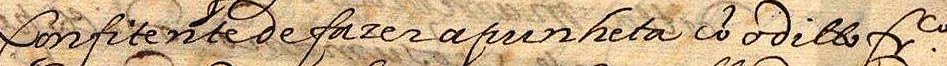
Confitente de fazer a punheta cō o ditto frco.
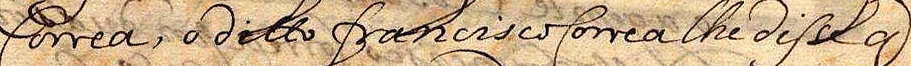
Correa, o ditto francisco Correa lhe disse q̄
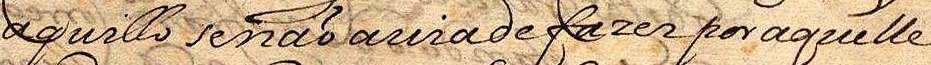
aquillo se naõ auia de fazer por aquelle
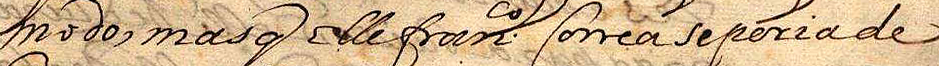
modo, mas q̄ Elle franco. Correa se poria de
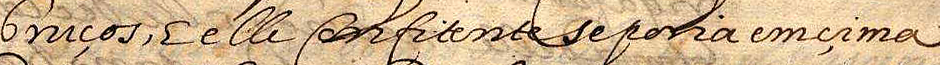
bruços, E elle Confitente se poria em çima
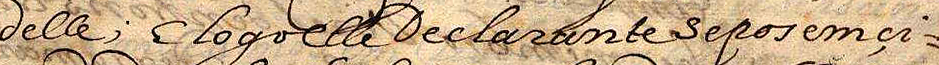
delle; E logo elle Declarante se pos em çi
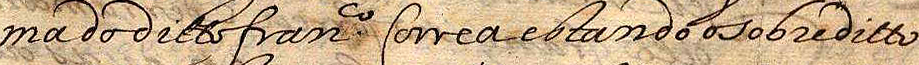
ma do ditto franco. Correa estando o sobreditto
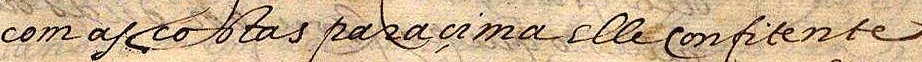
com as costas para çima Elle confitente
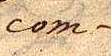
com
